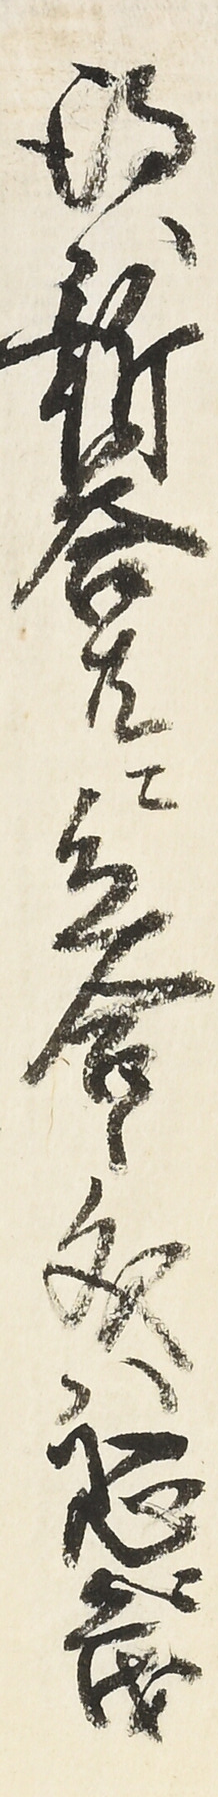得ハ訴答共に立合候義ハ恐ニ茂
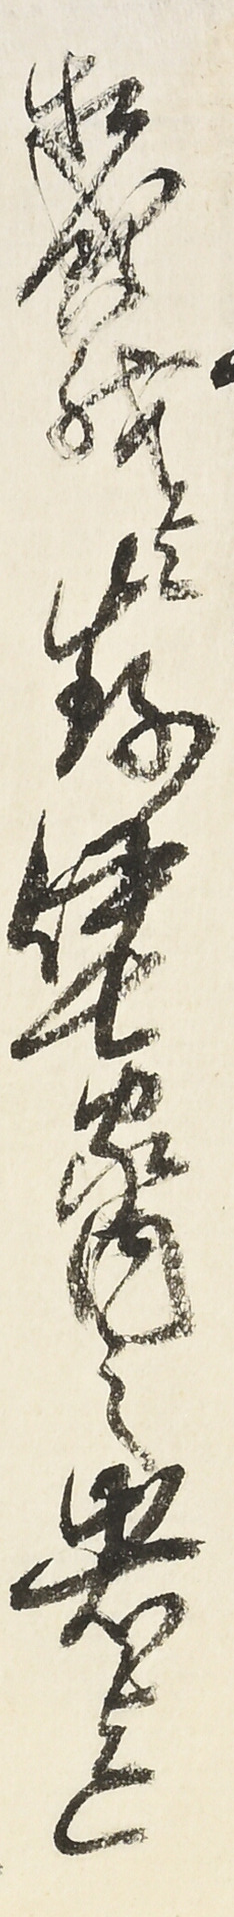相成義与存伊七家内之者迄
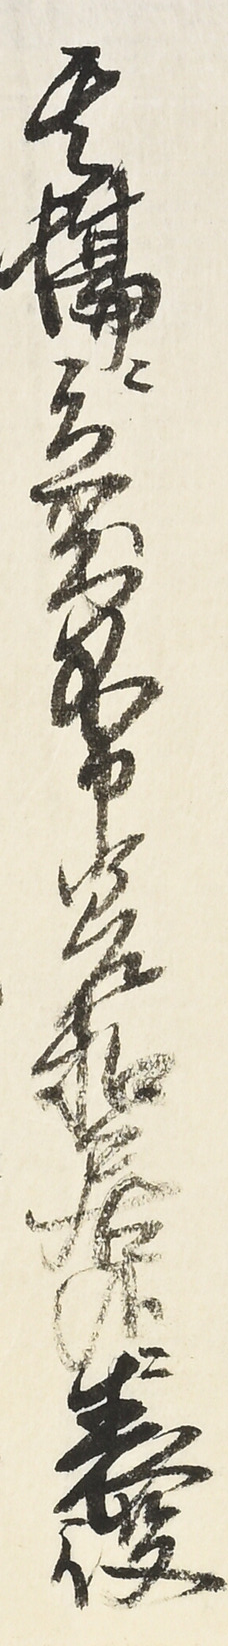其場ニ立出不申差扣居候ニ表役
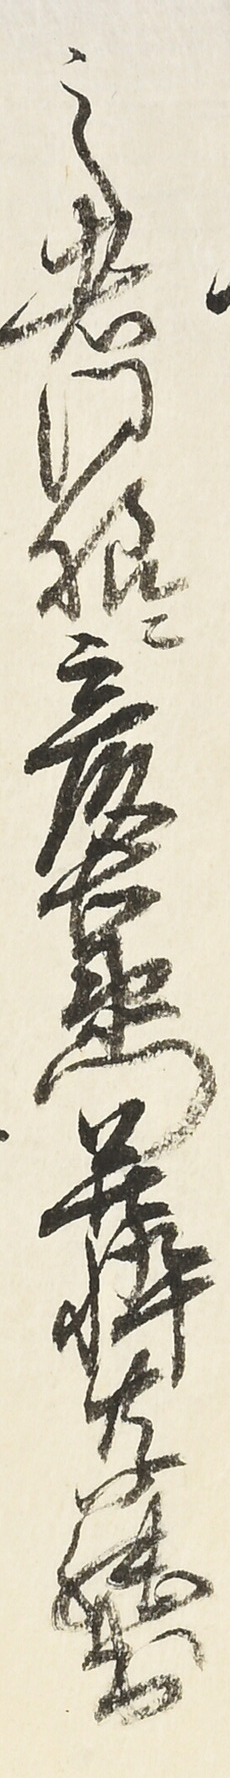之者同様に彦右衛門并倅出
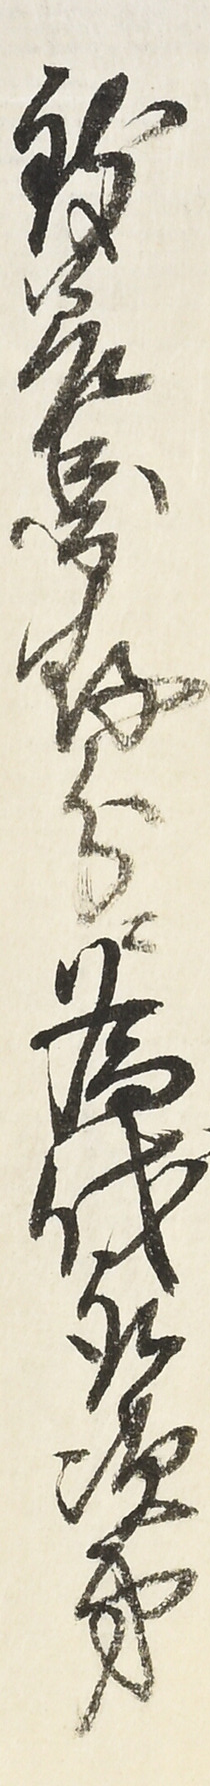致差図存分ニ為伐取次第
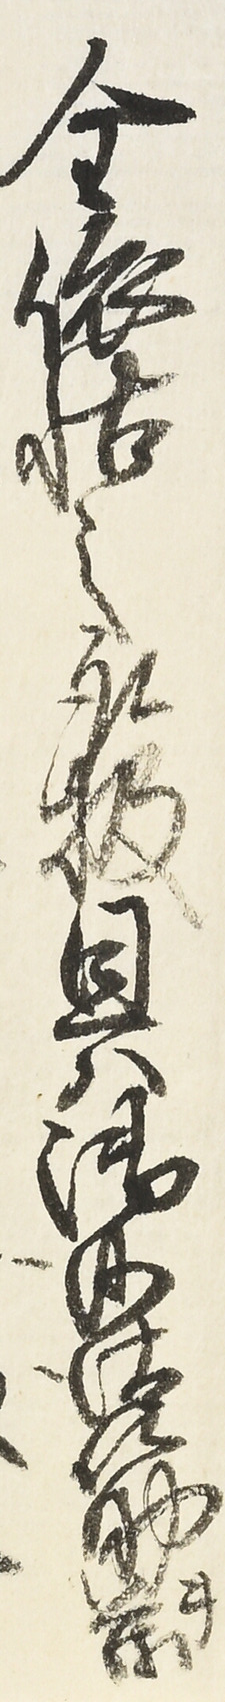全依怙之取扱且ハ御沙汰筋ヲ茂
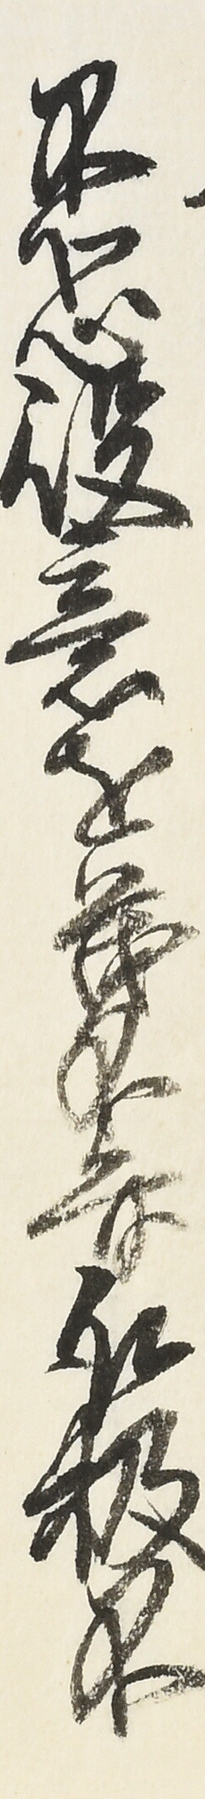不恐役意を茂不弁取扱不
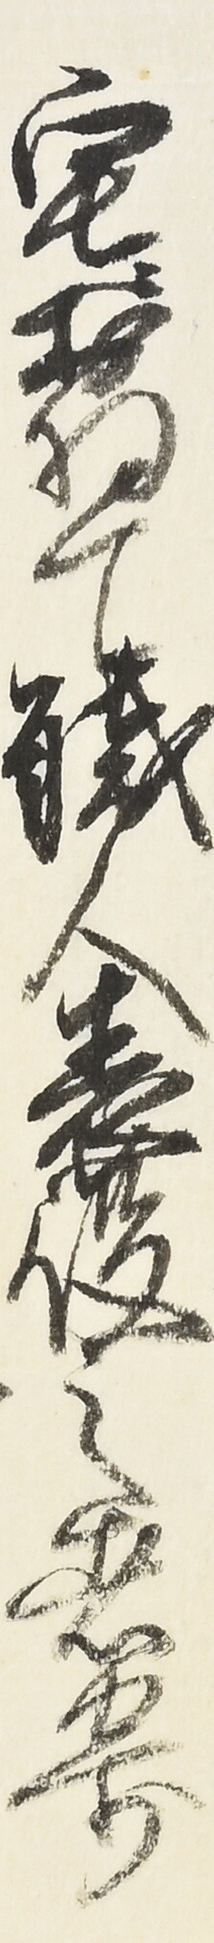宅ニおゐて職人表役之者寄

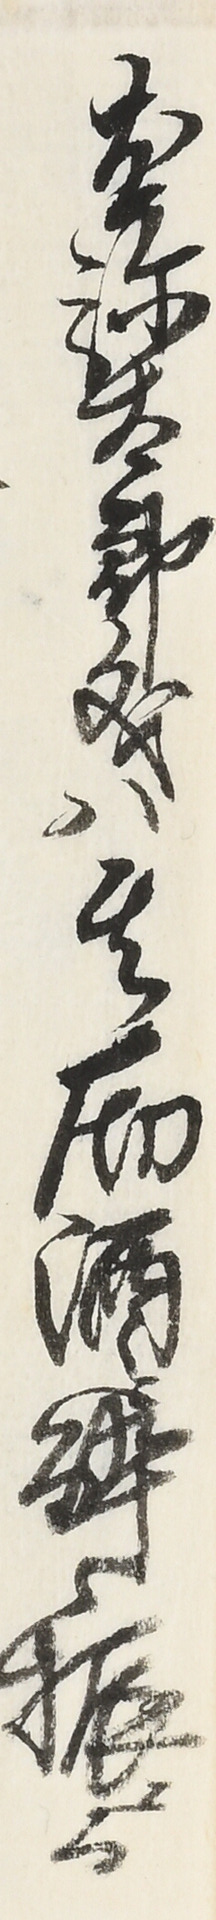尤弥太郎義ハ其励酒酔候振ニ而
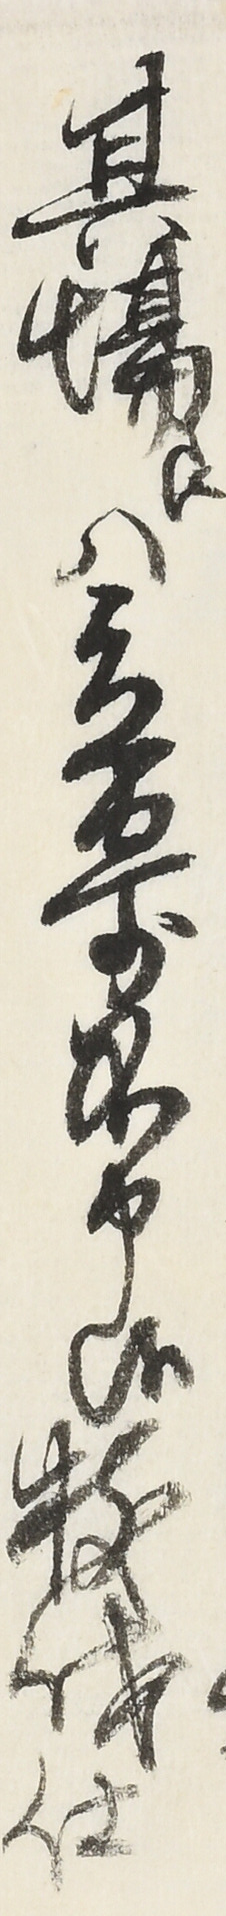其場江ハ立寄不申候枝伐仕
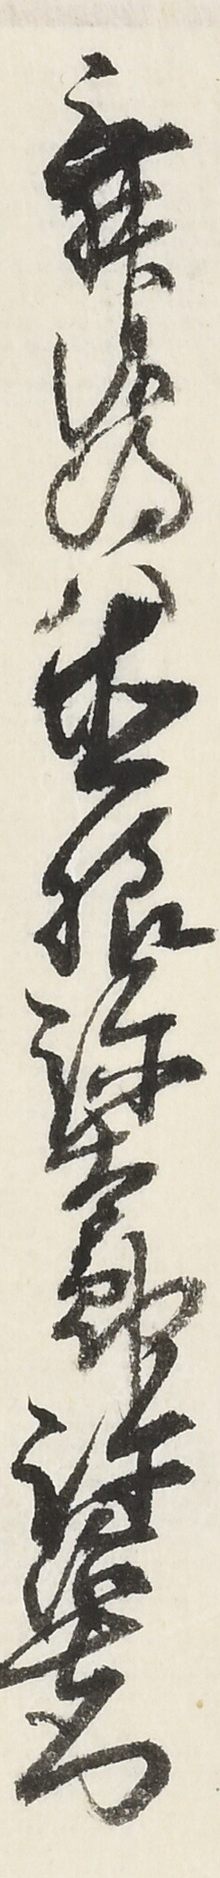不舞候得ハ直様弥太郎弥治右衛門
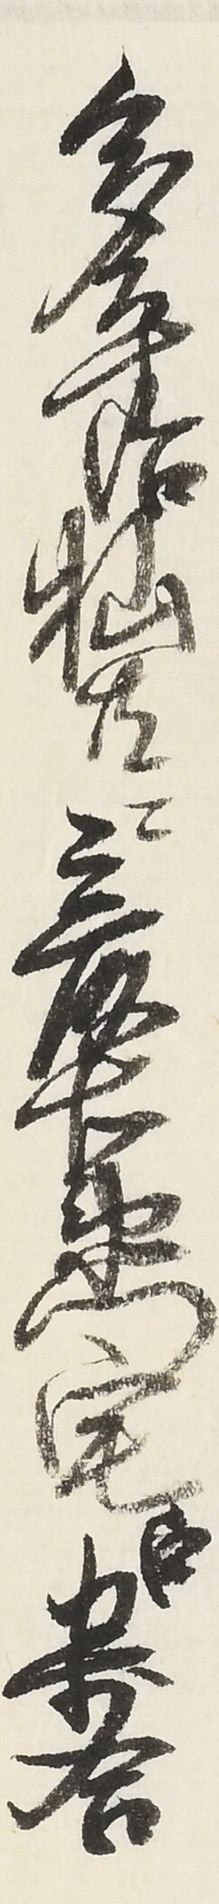多平治杣共ニ彦右衛門宅江寄合
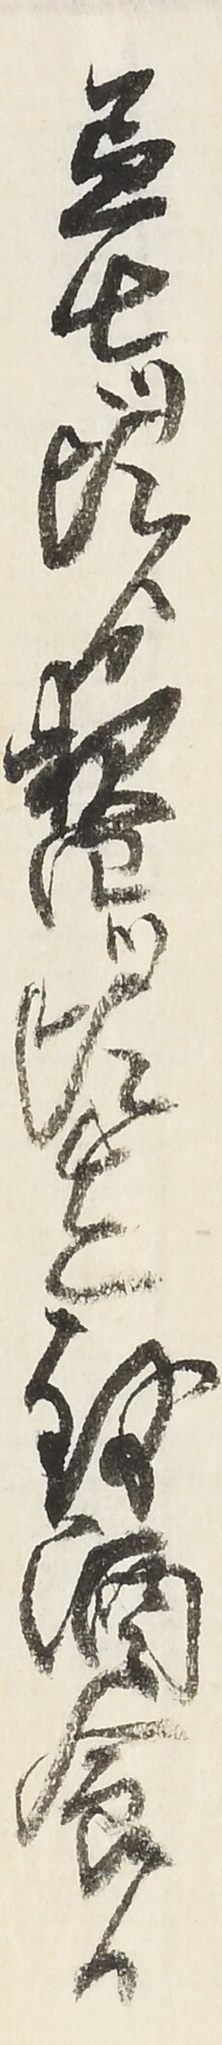昼七ツ頃より夜四ツ頃迄致酒食候
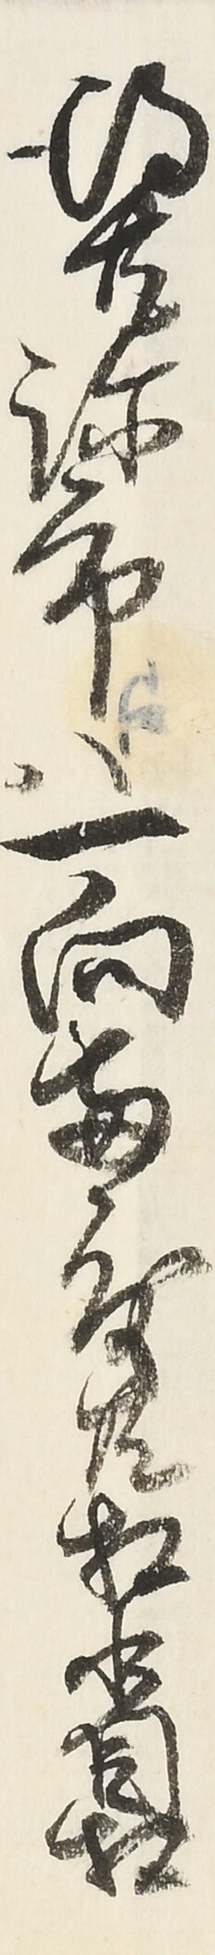得共弥市ハ一向両度共相省相
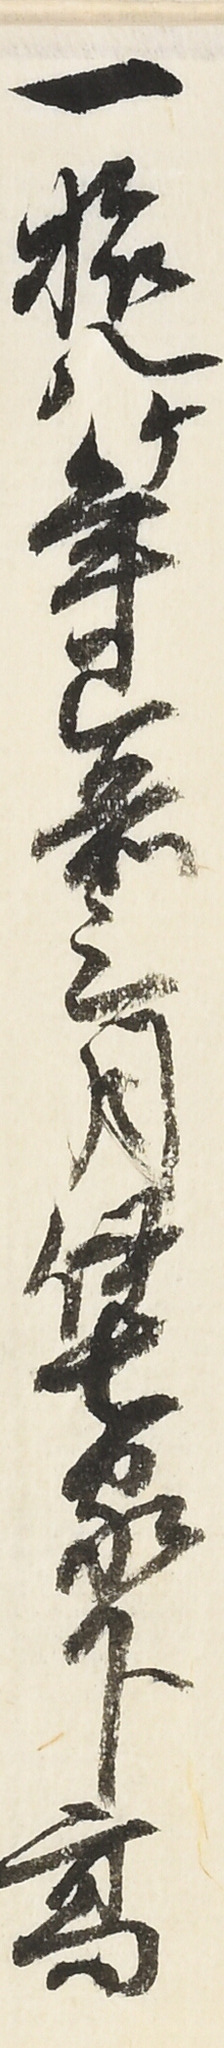一拾八ケ年已前三月伊七家下高
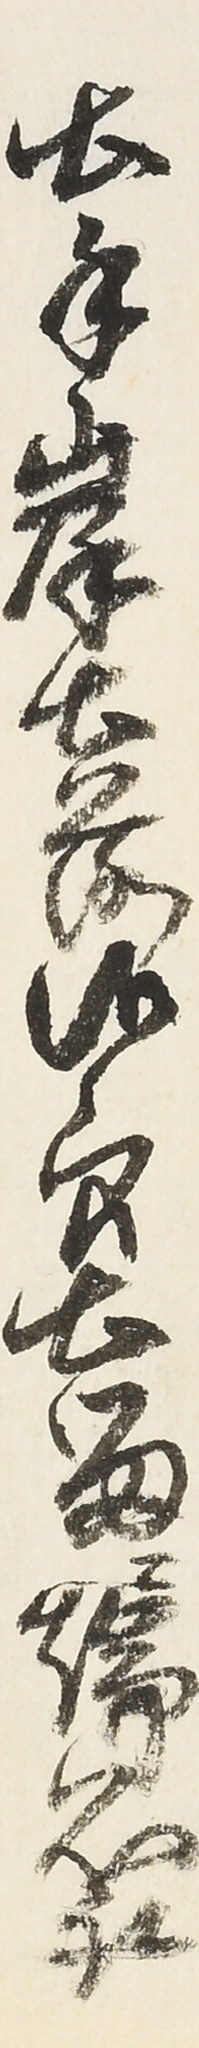土手岸土落候間土留ニ端石取
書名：乍恐御内々子委奉申上度口上書
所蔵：伊那市立高遠町図書館・合同会社AMANE
